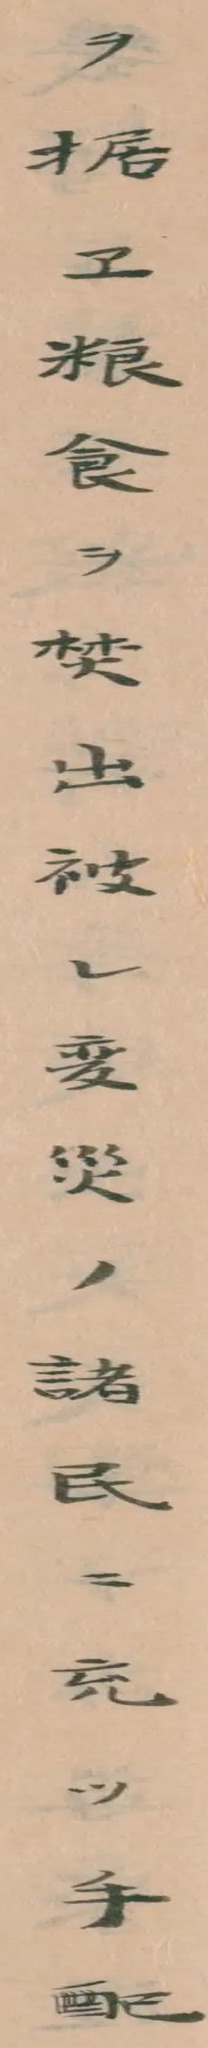ヲ据ヱ糧食ヲ焚出被レ変災ノ諸民ニ充ツ手配
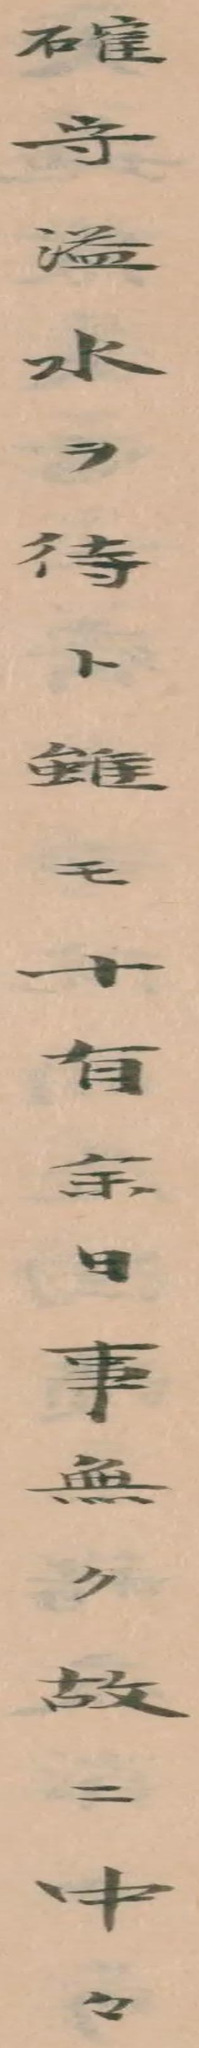確守溢水ヲ待ト雖モ十有余日事無ク故ニ中々
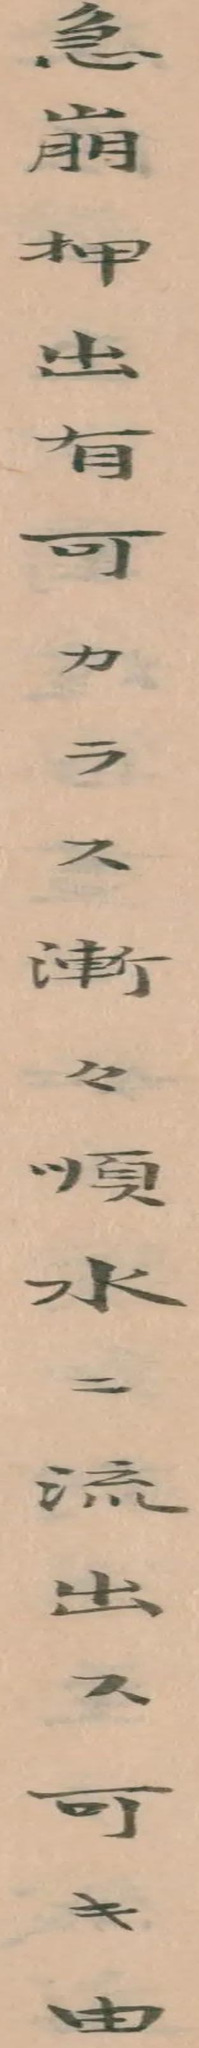急崩押出有可カラス漸々順水ニ流出ス可キ由
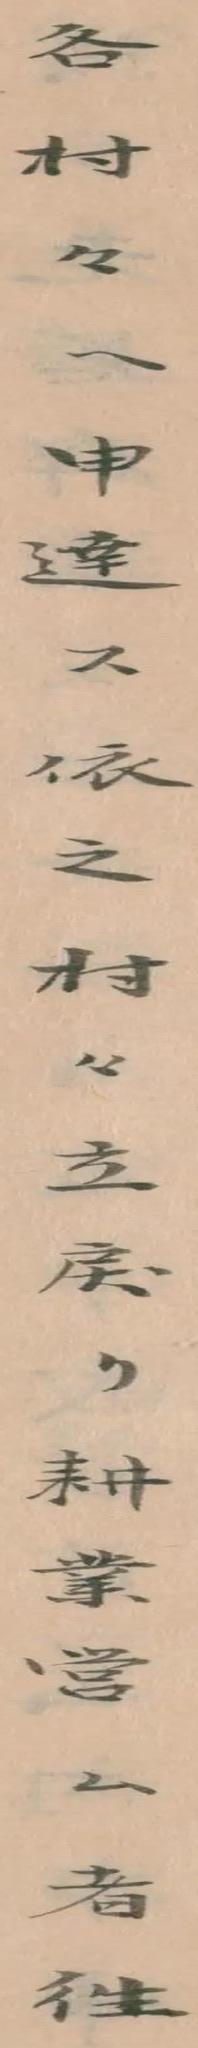各村々ヘ申達ス依之村々立戻リ耕業営ム者往
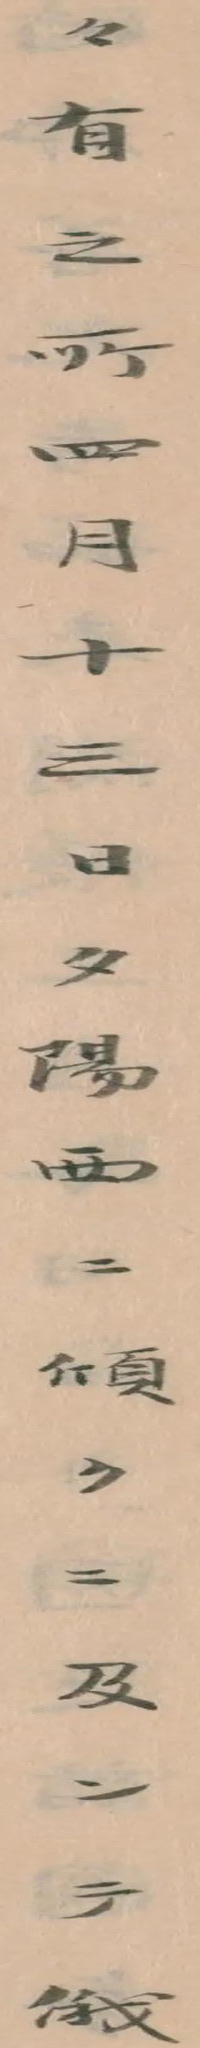々有之所四月十三日夕陽西ニ傾クニ及ンテ俄
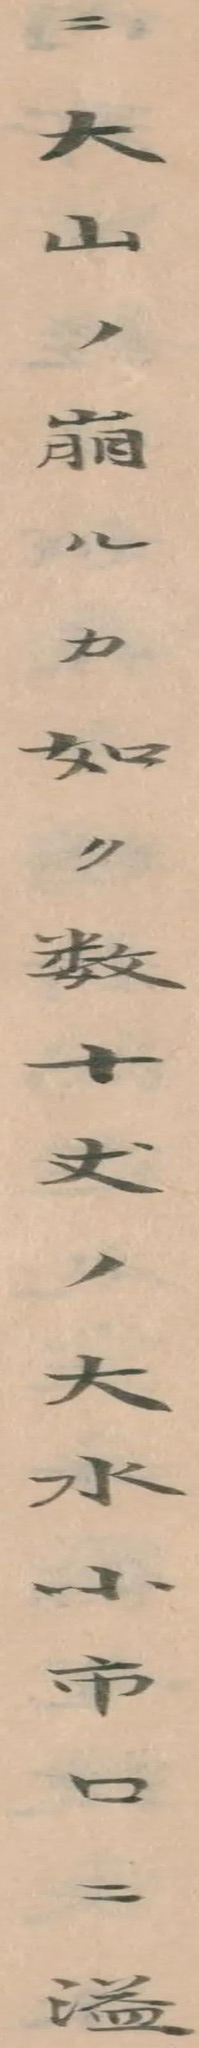ニ大山ノ崩ルカ如ク数十丈ノ大水小市口ニ溢
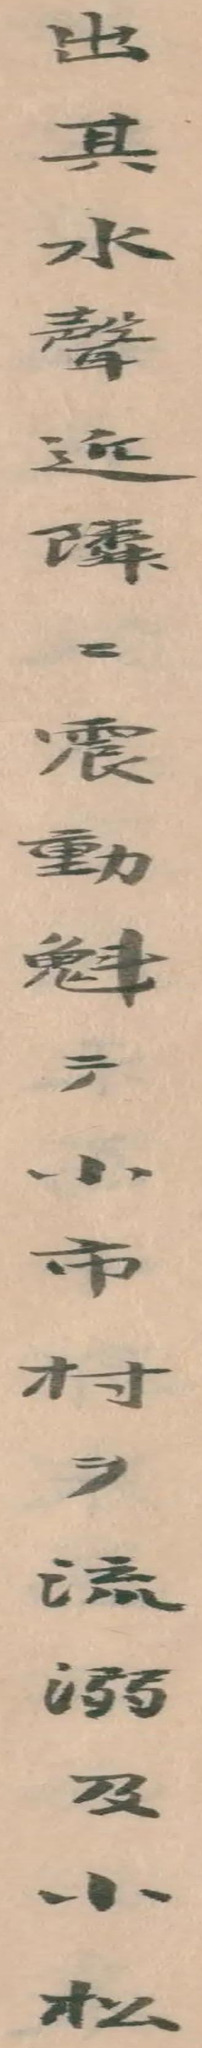出其水声近隣ニ振動魁テ小市村ヲ流溺及小松
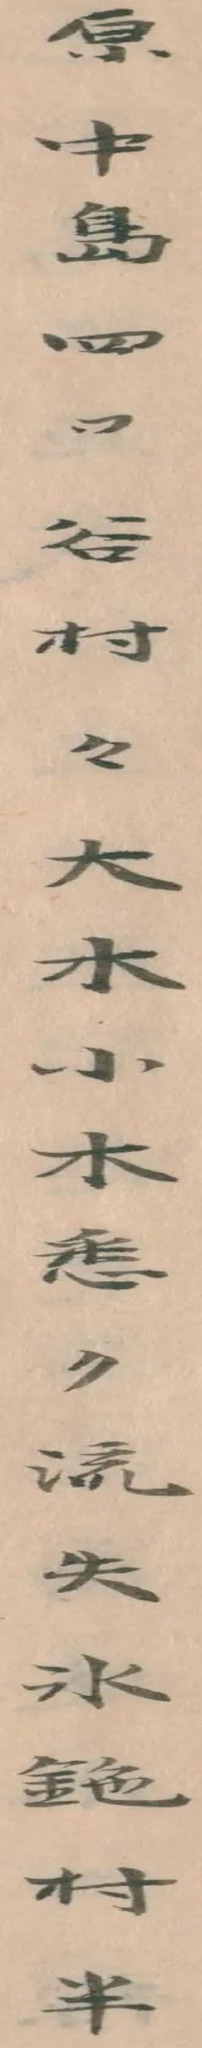原中島四ツ谷村々大木小木悉ク流失氷鉇村半
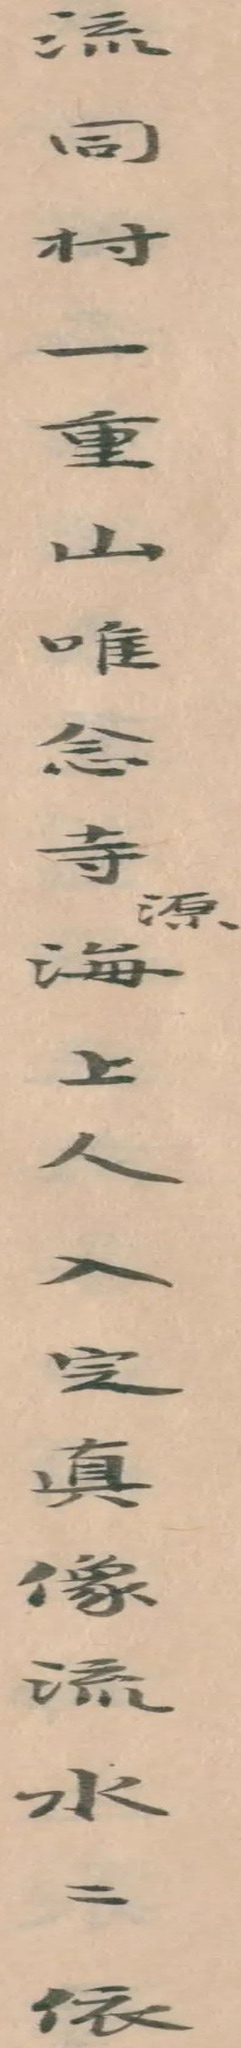流同村一重山唯念寺源海上人入定真像流水ニ依
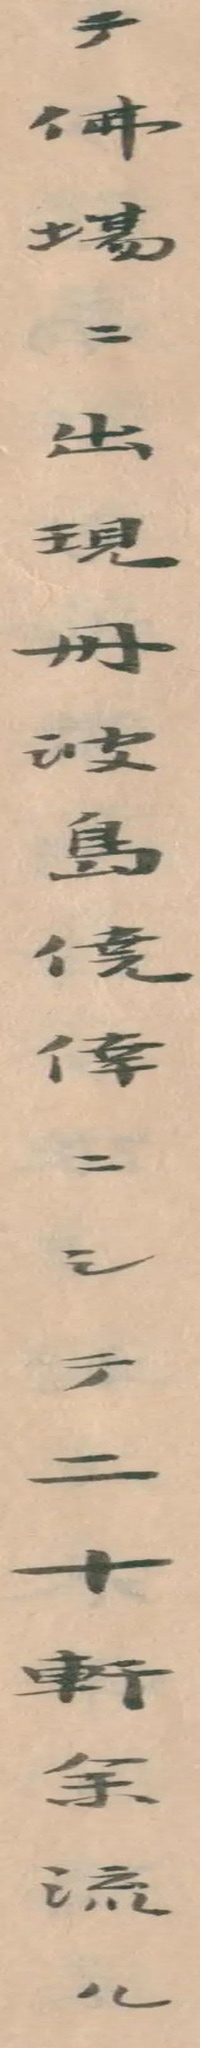テ仏場ニ出現丹波島僥倖ニシテ二十軒余流ル

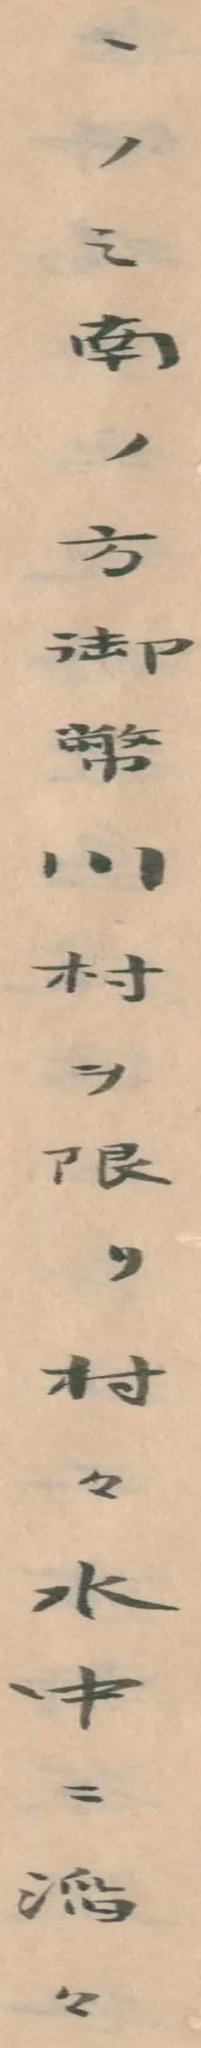ヽノミ南ノ方御幣川村ヲ限リ村々水中に滔々
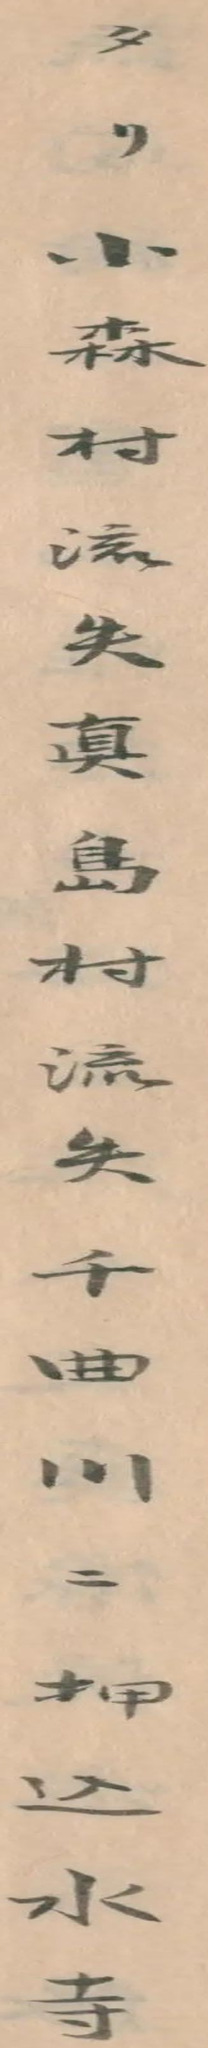タリ小森村流失真島村流失千曲川ニ押込水寺
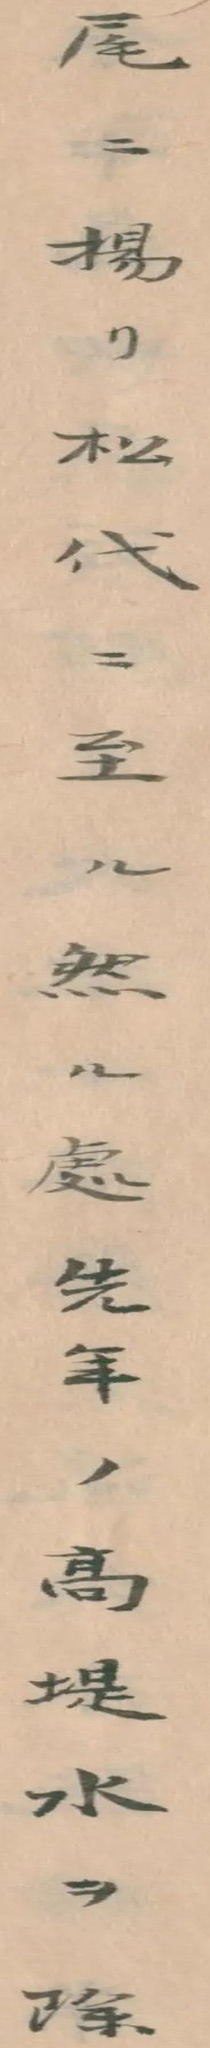尾ニ揚リ松代ニ至ル然ル処先年ノ高堤水ヲ除
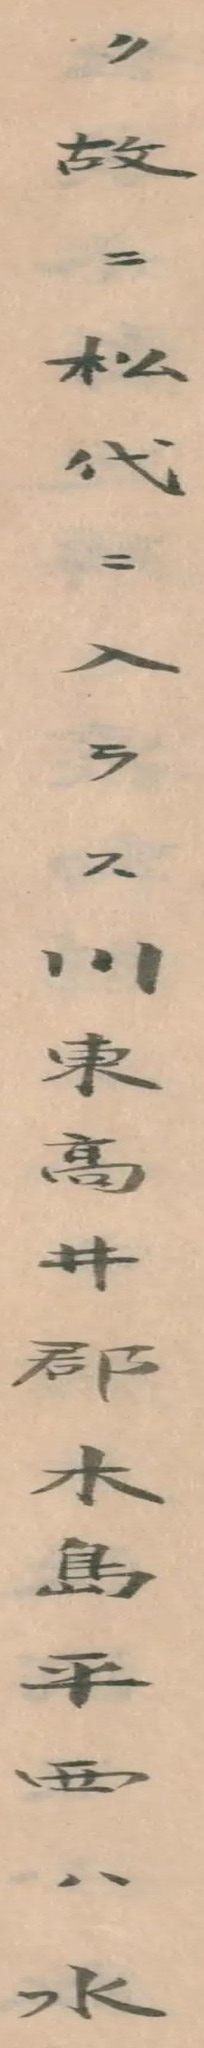ク故ニ松代ニ入ラス川東高井郡木島平西ハ水
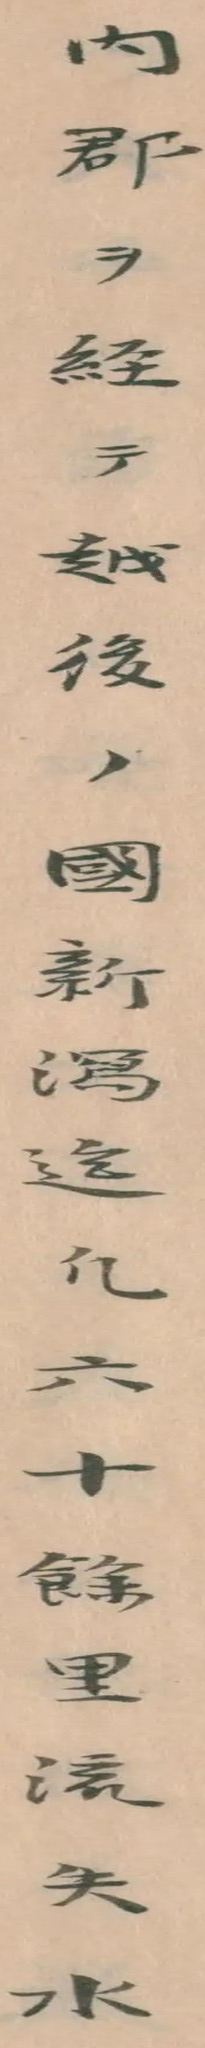内郡ヲ経テ越後ノ国新潟迄凡六十余里流失水
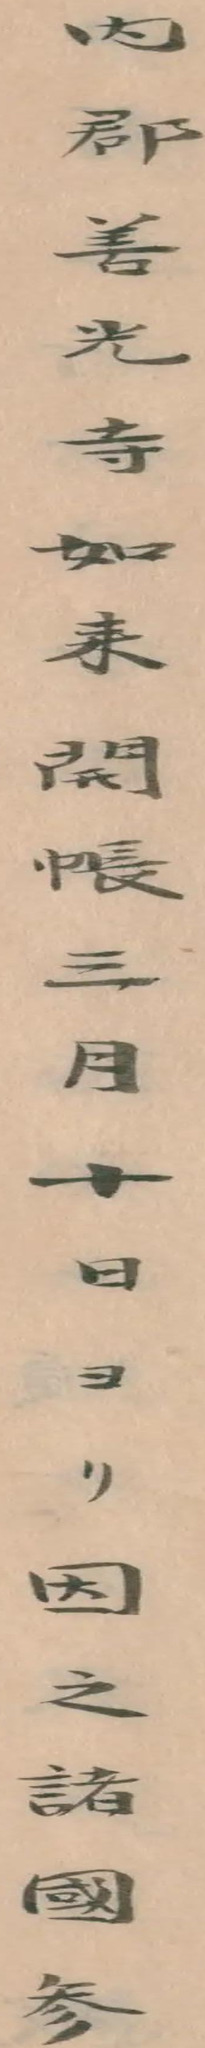内郡善光寺如来開帳三月十日ヨリ因之諸国参
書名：地災撮要. 巻5-6(地震之部)
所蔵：国立国会図書館 National Diet Library, JAPAN
